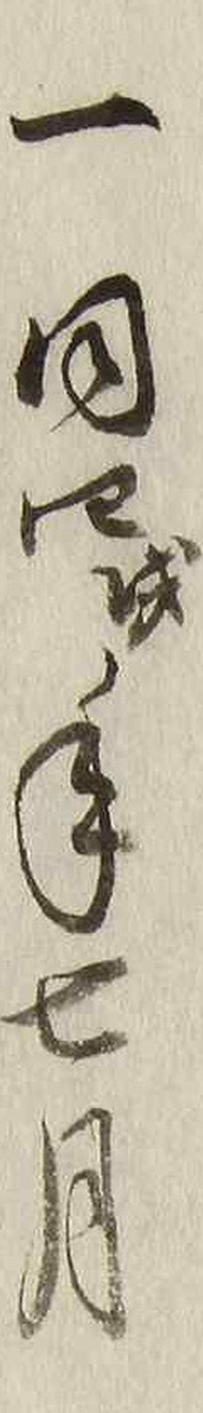一同四戌年七月
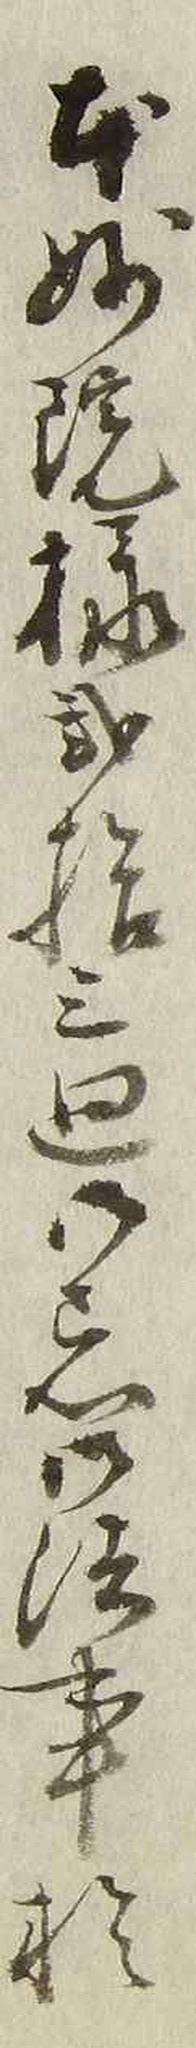本妙院様弐拾三廻御忌御法事於
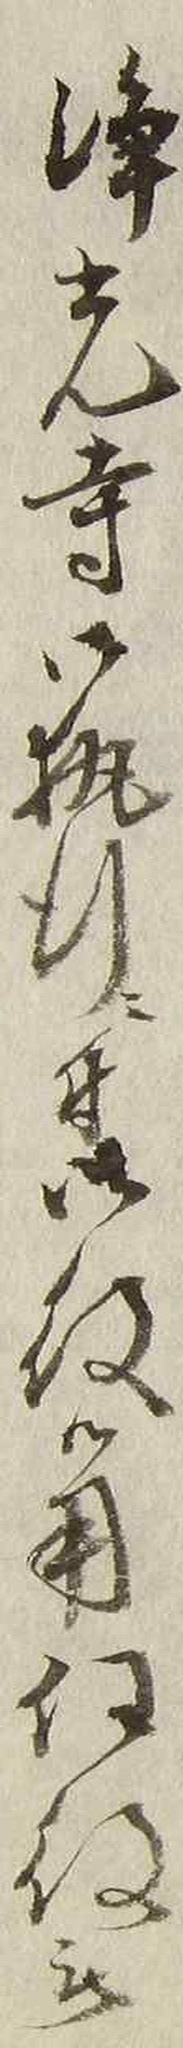浄光寺御執行ニ付御役御用任役被
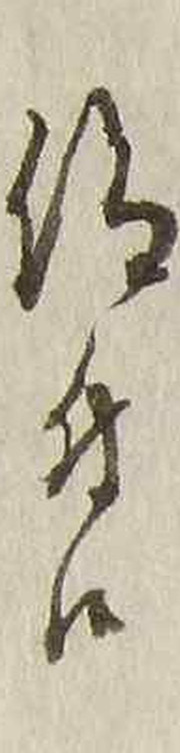仰付候
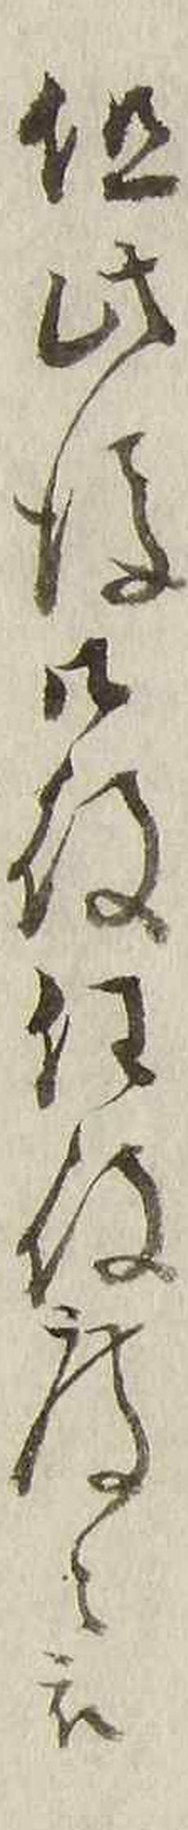但此後御役任役度々被

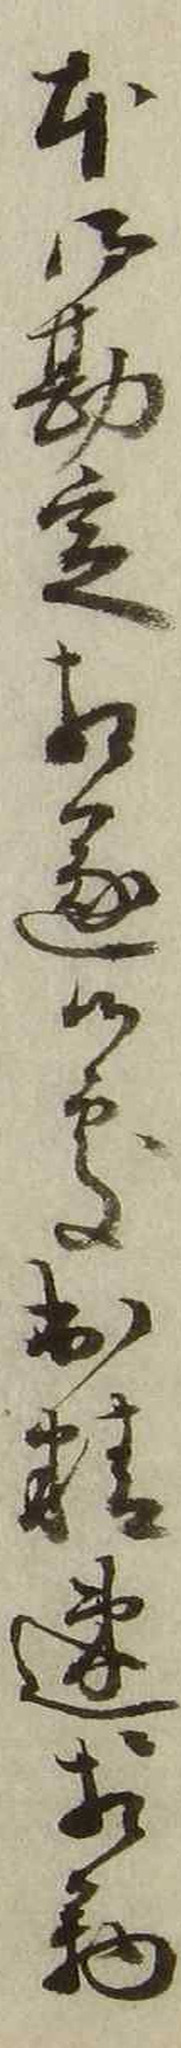本御勘定相遂候処出精速ニ相勤
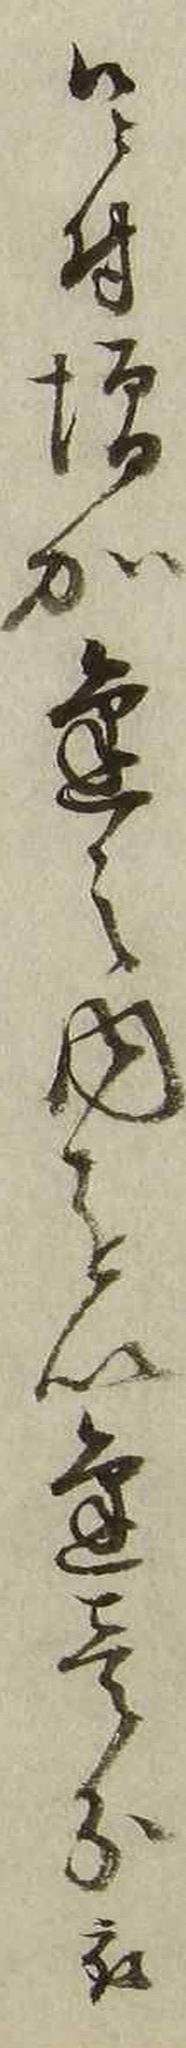候ニ付増加金之内を以金壱分被
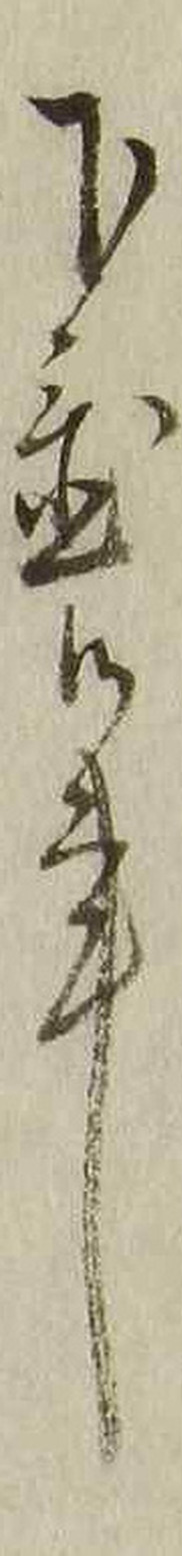下置候事
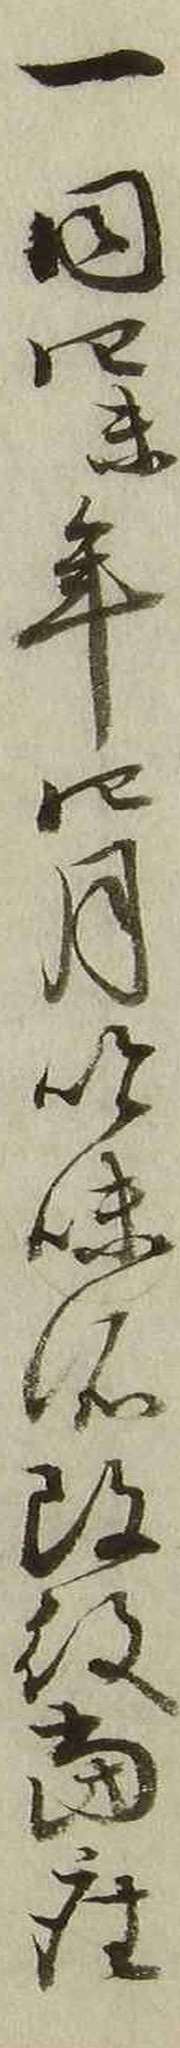一同四未年四月吟味所改役当座
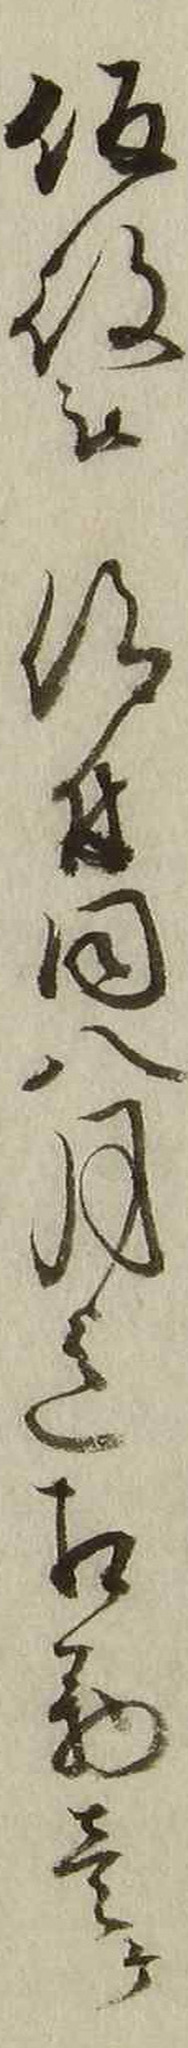仮役被仰付同八月迄相勤壱ヶ
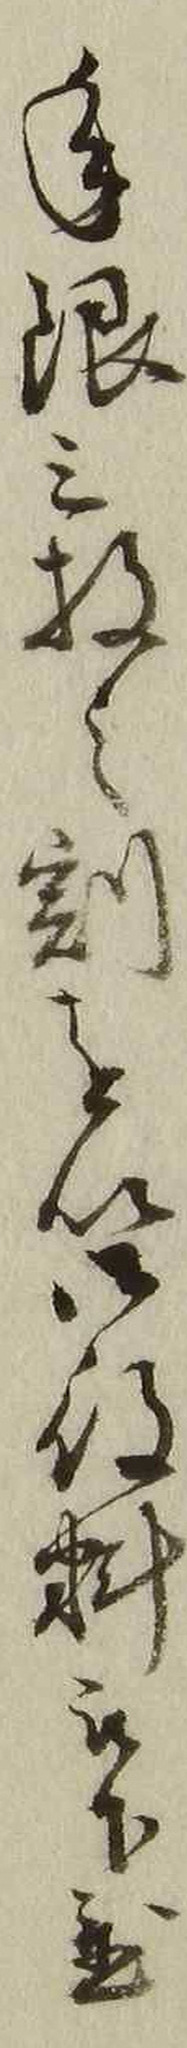年銀三枚之割を以御役料被下置
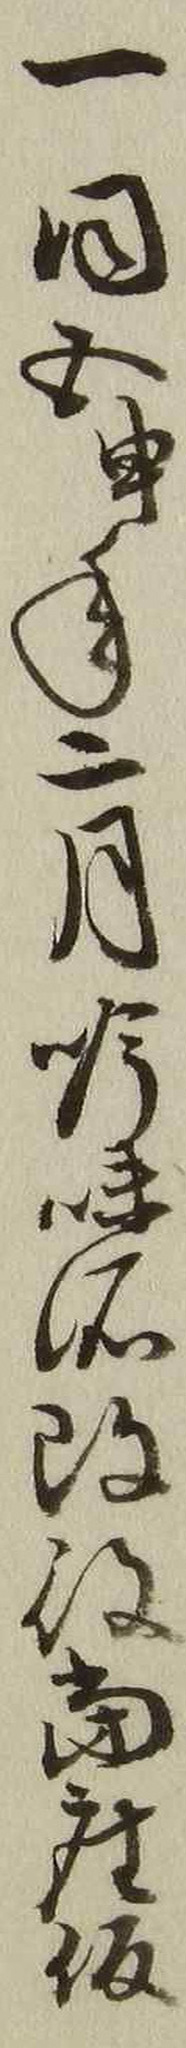一同五申年二月吟味所改役当座仮
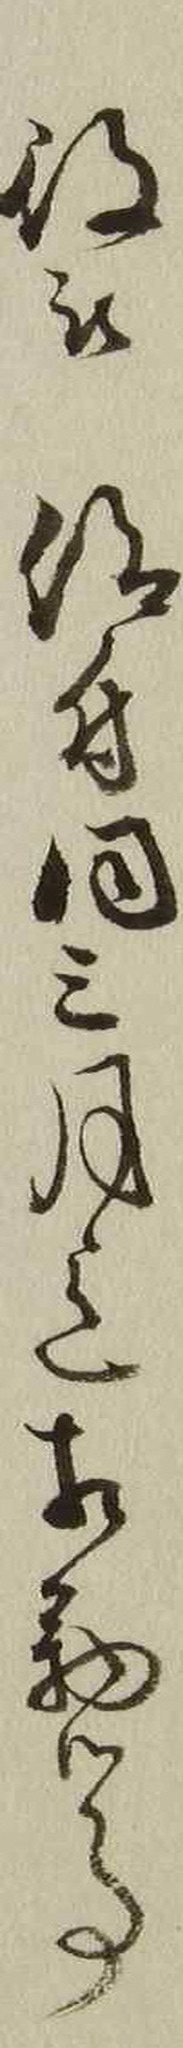役被仰付同三月迄相勤候事
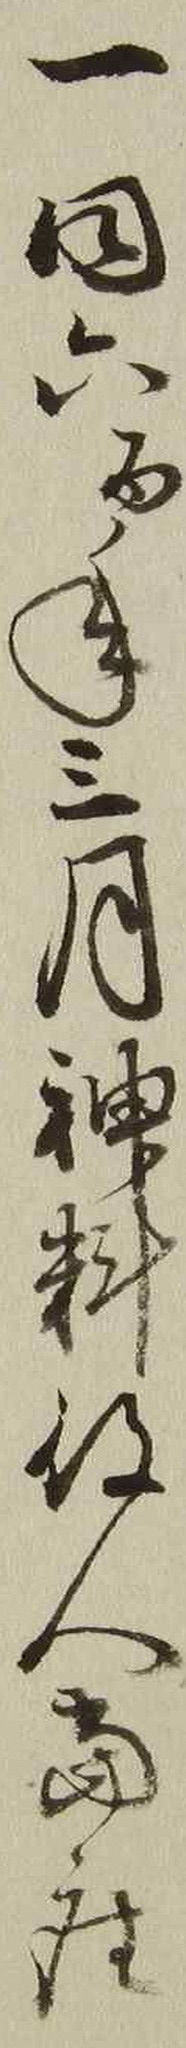一同六酉年三月神料役人当座
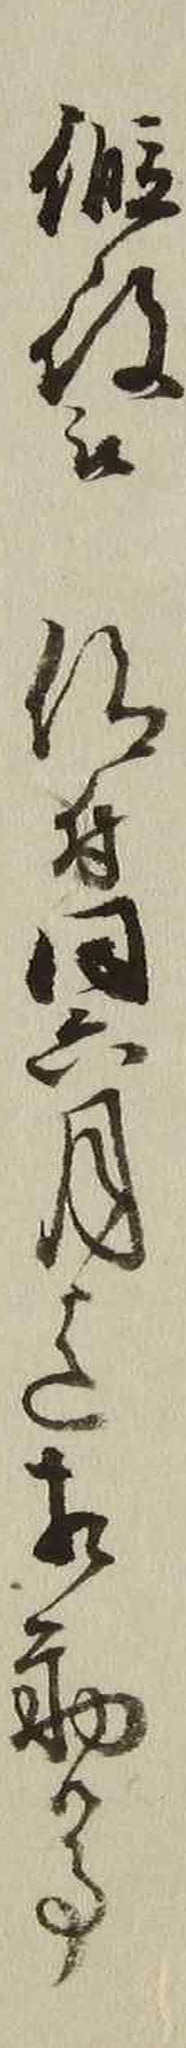仮役被仰付同六月迄相勤候事
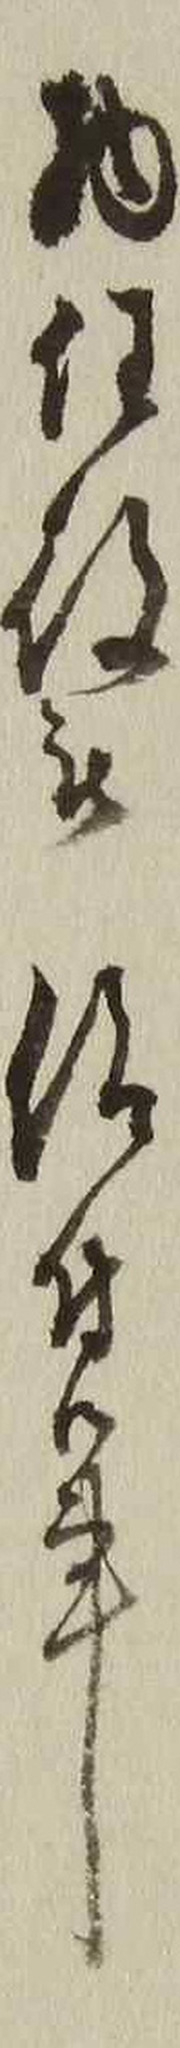物任役被仰付候事
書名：諸士系譜　巻之39　は之部7
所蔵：会津若松市立会津図書館
